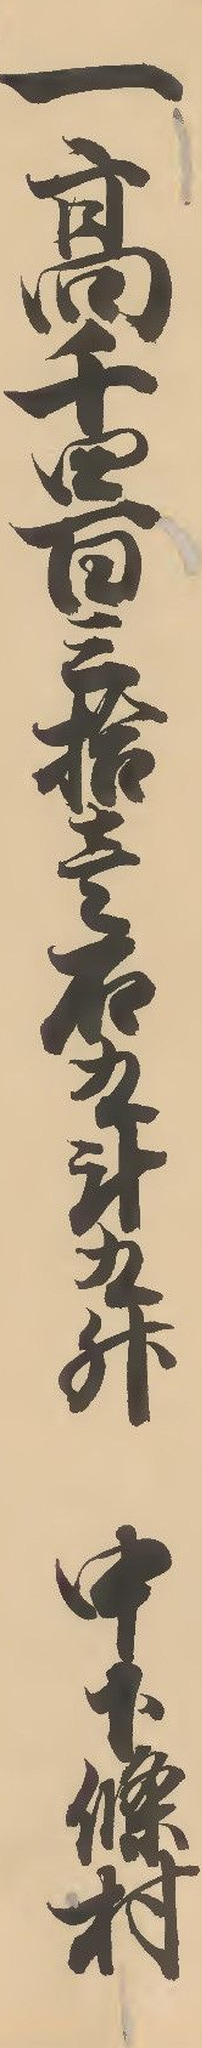一高千四百三拾壱石九斗九升中下条村
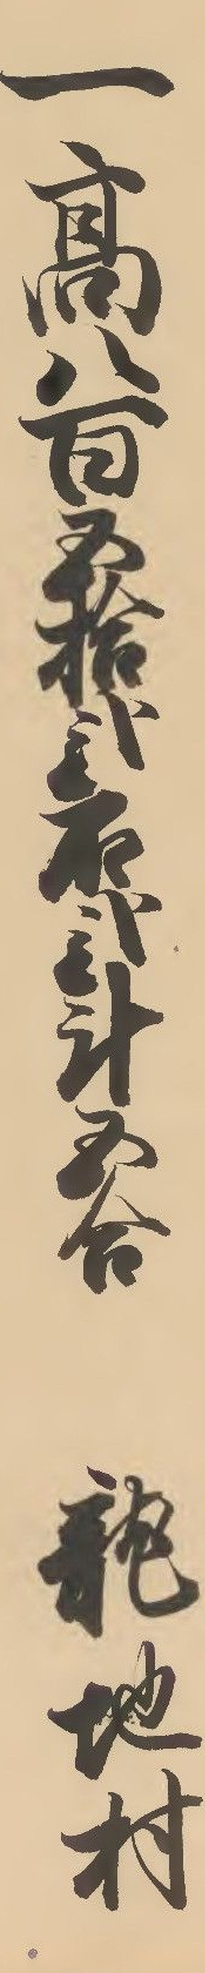一高八百五拾弐石弐斗五合竜地村
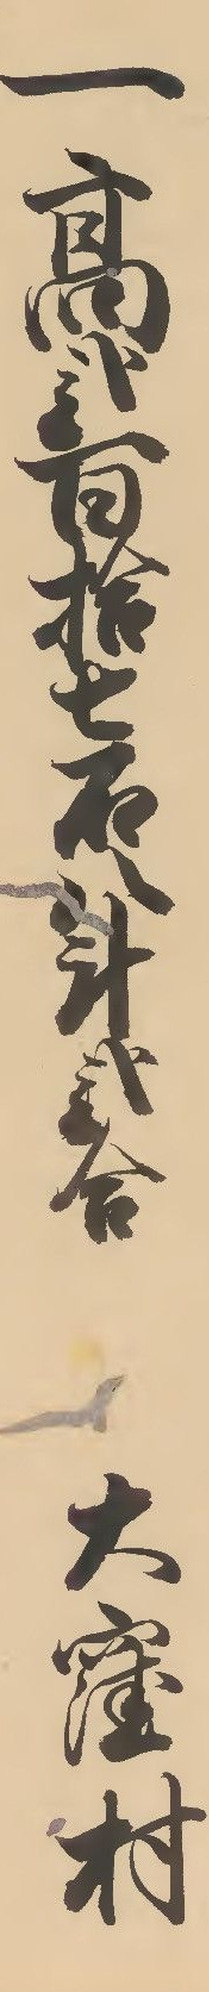一高弐百拾七石八斗弐合大窪村

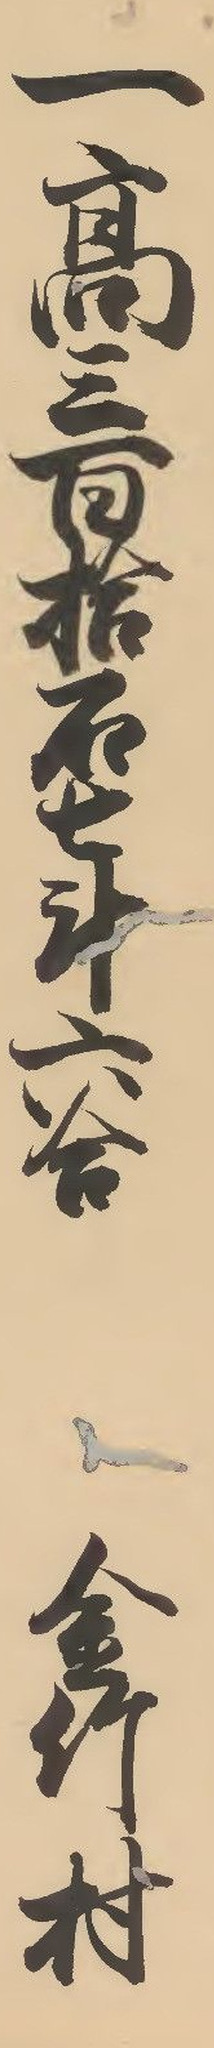一高三百拾石七斗六合金竹村
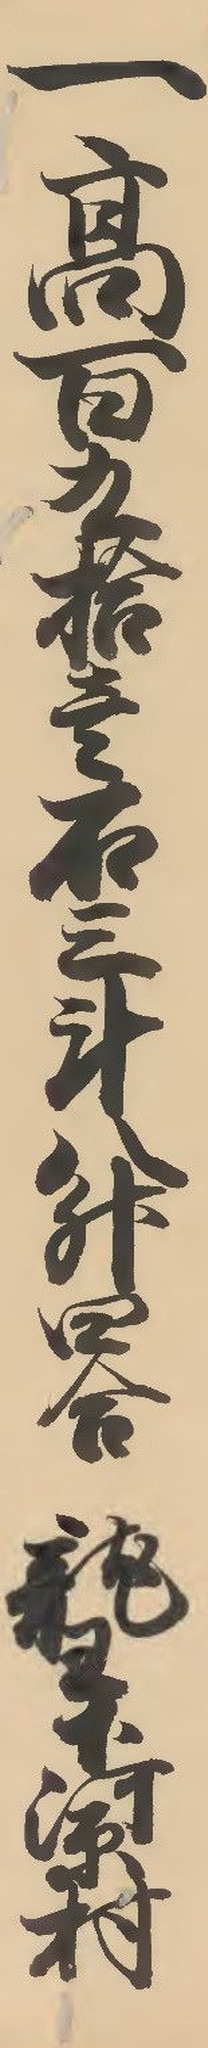一高百九拾壱石三斗八升四合竜王下河原村
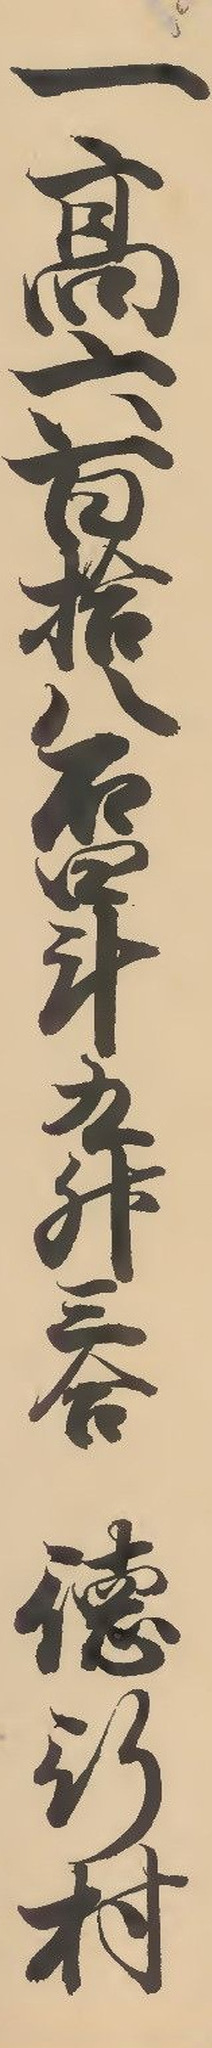一高六百拾八石四斗九升三合徳行村
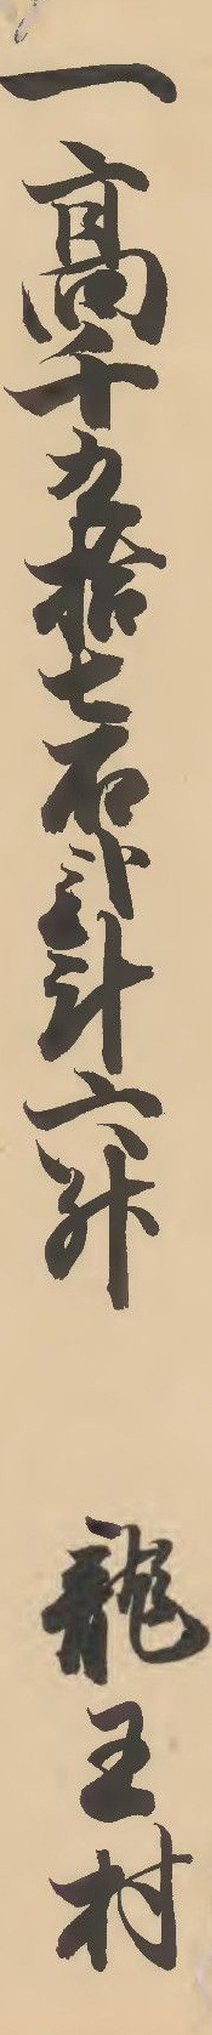一高千九拾七石弐斗六升竜王村
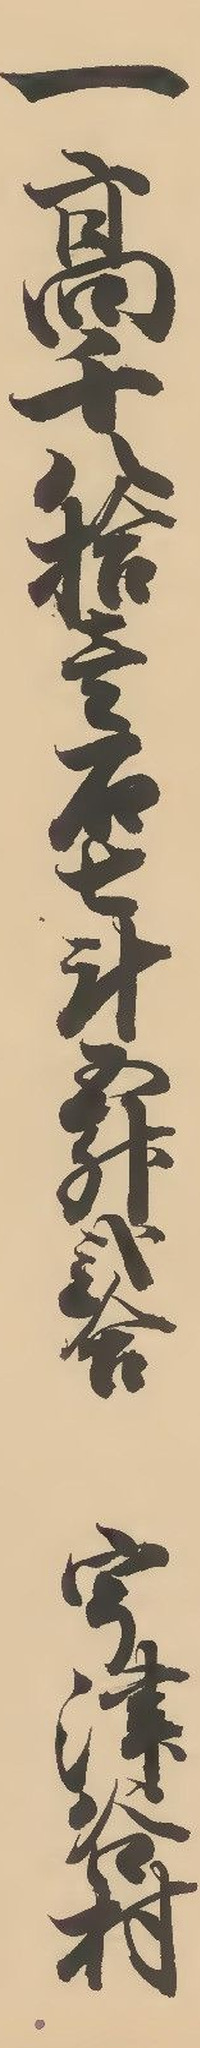一高千八拾壱石七斗五升弐合宇津谷村
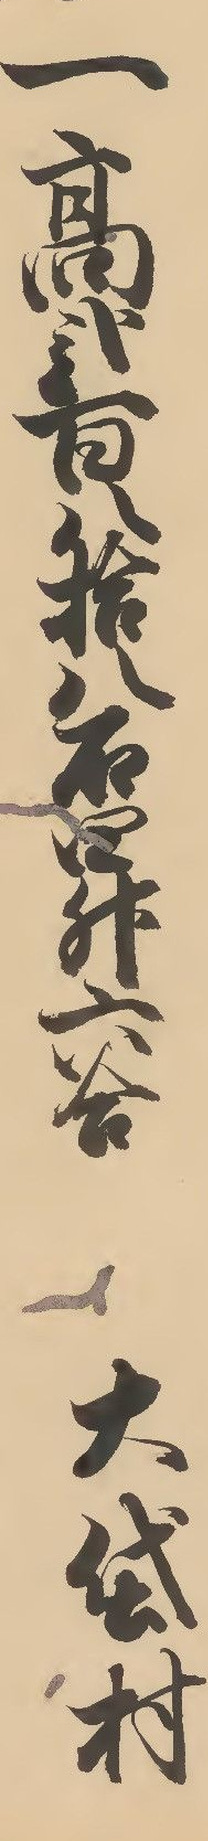一高弐百八拾八石四升六合大垈村

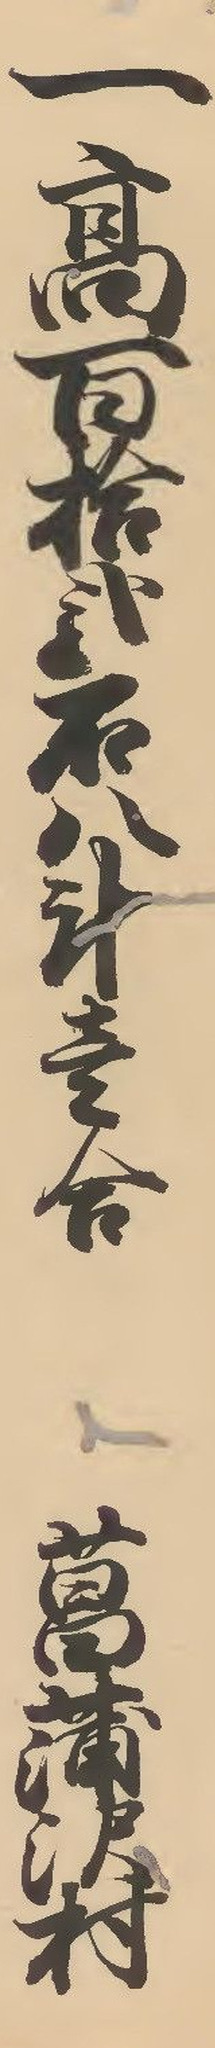一高百拾弐石八斗壱合菖蒲沢村
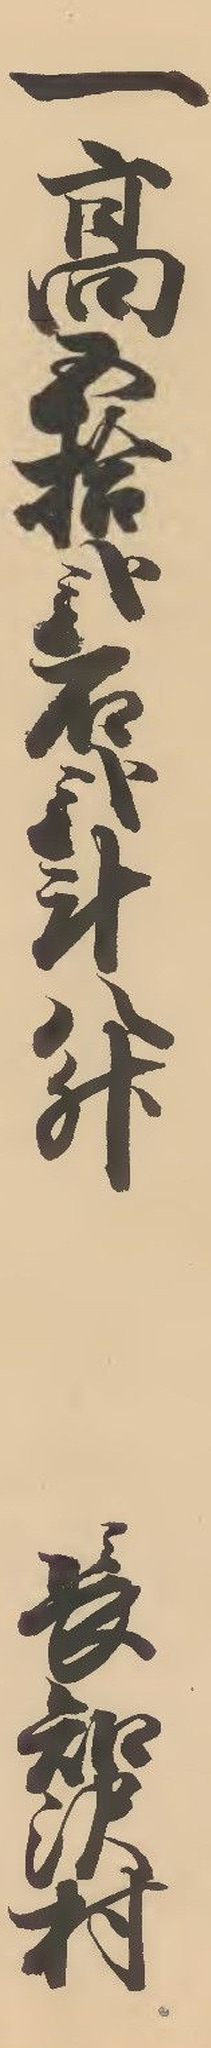一高五拾弐石弐斗八升長知沢村
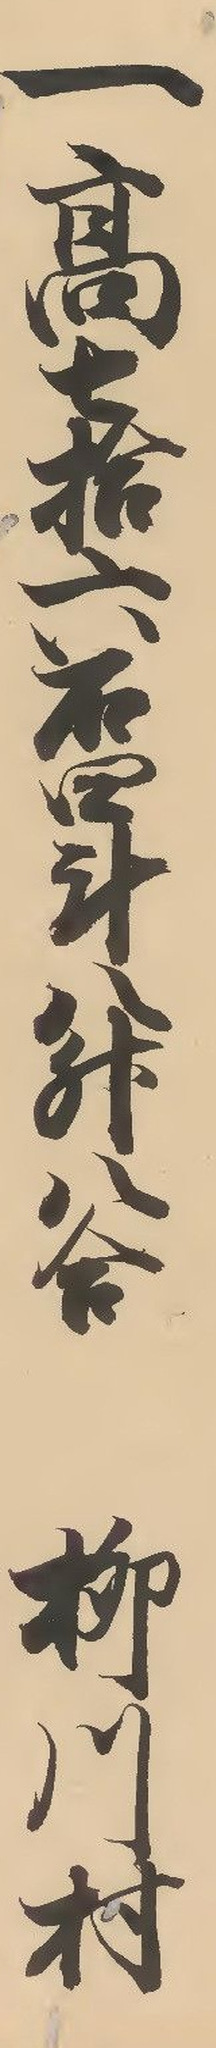一高七拾六石四斗八升八合柳川村
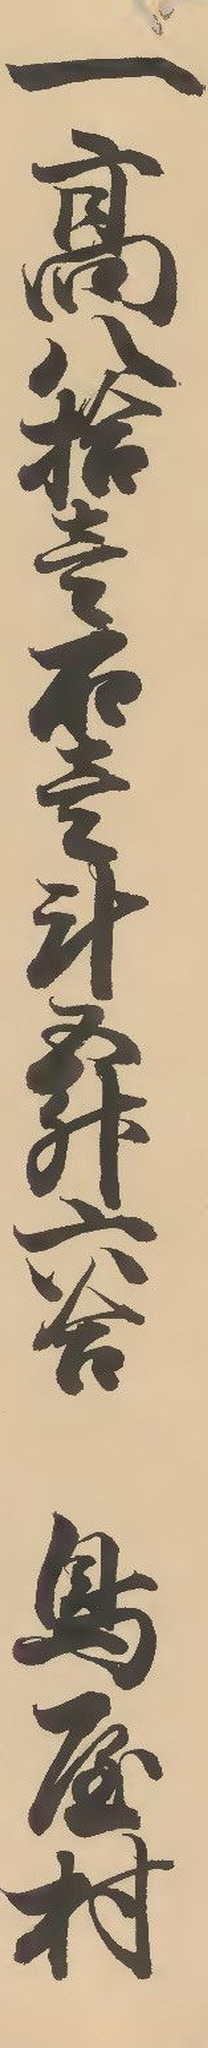一高八拾壱石壱斗五升六合鳥屋村
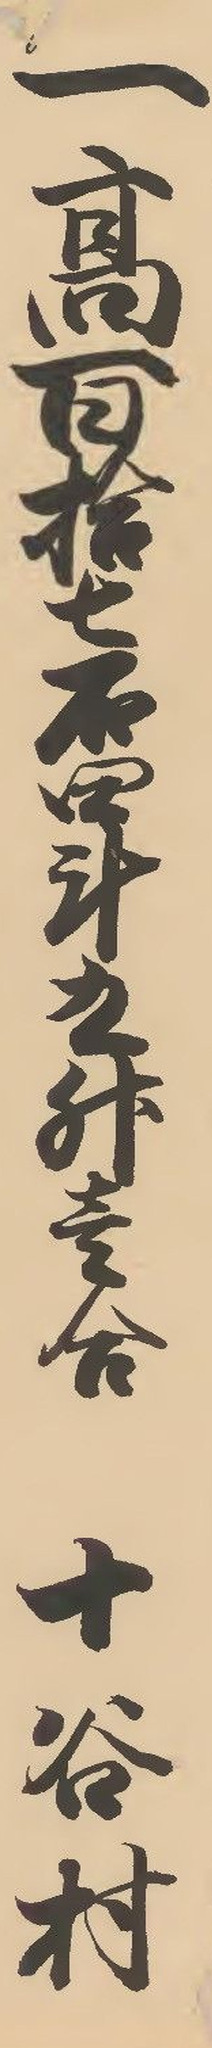一高百拾七石四斗九升壱合十谷村
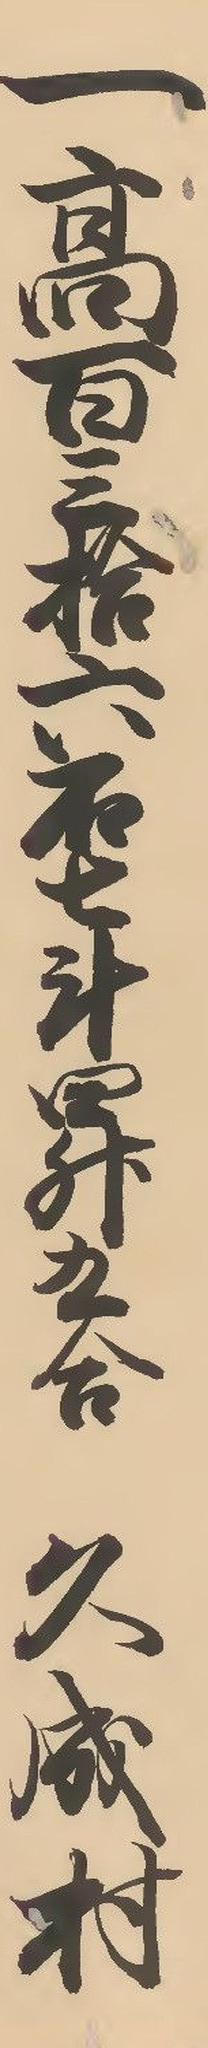一高百三拾六石七斗四升九合久成村
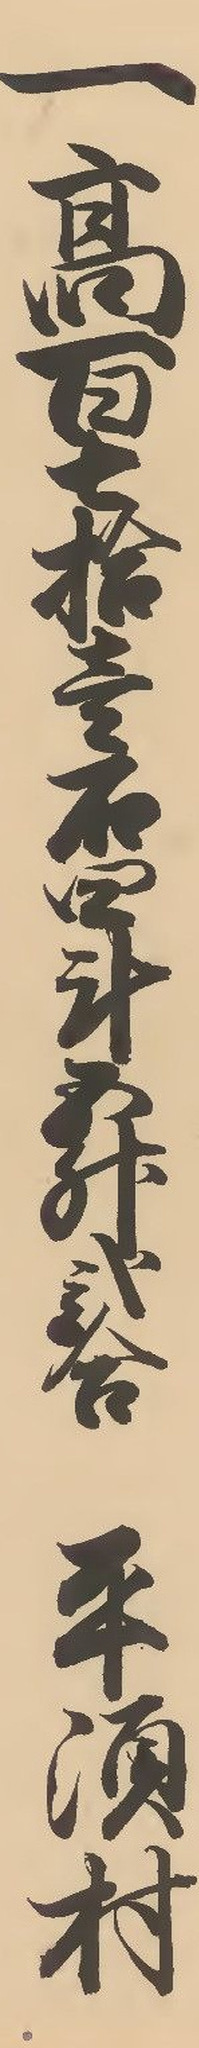一高百七拾壱石四斗五升弐合平須村
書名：甲斐国郷帳
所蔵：国立公文書館 National Archives of Japan
